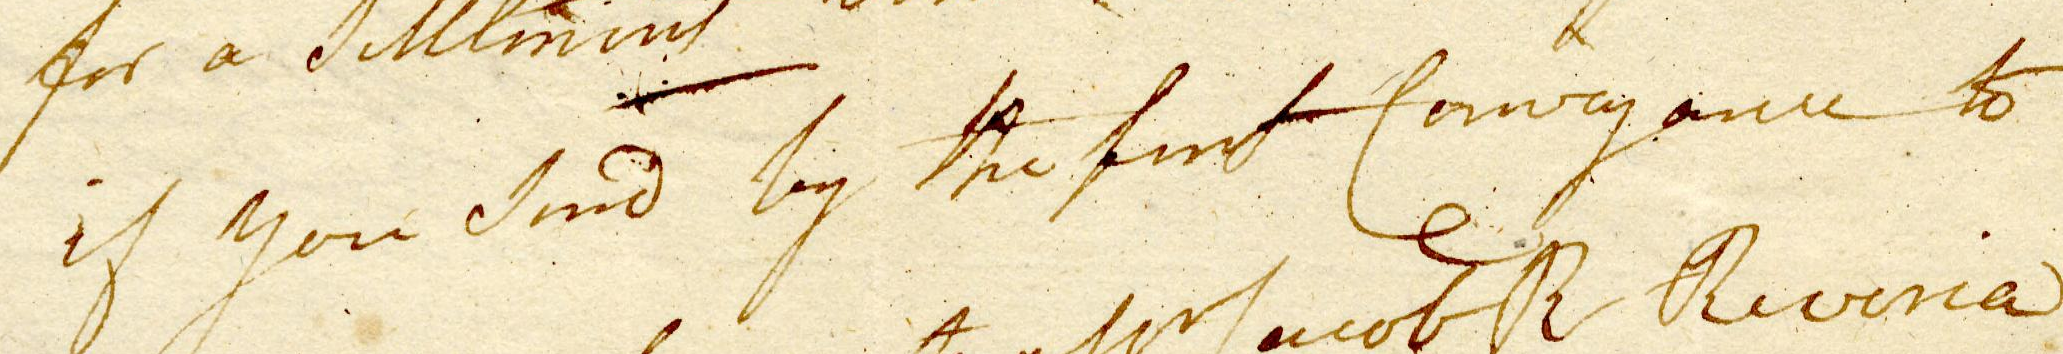if you send by the first Conveyance to
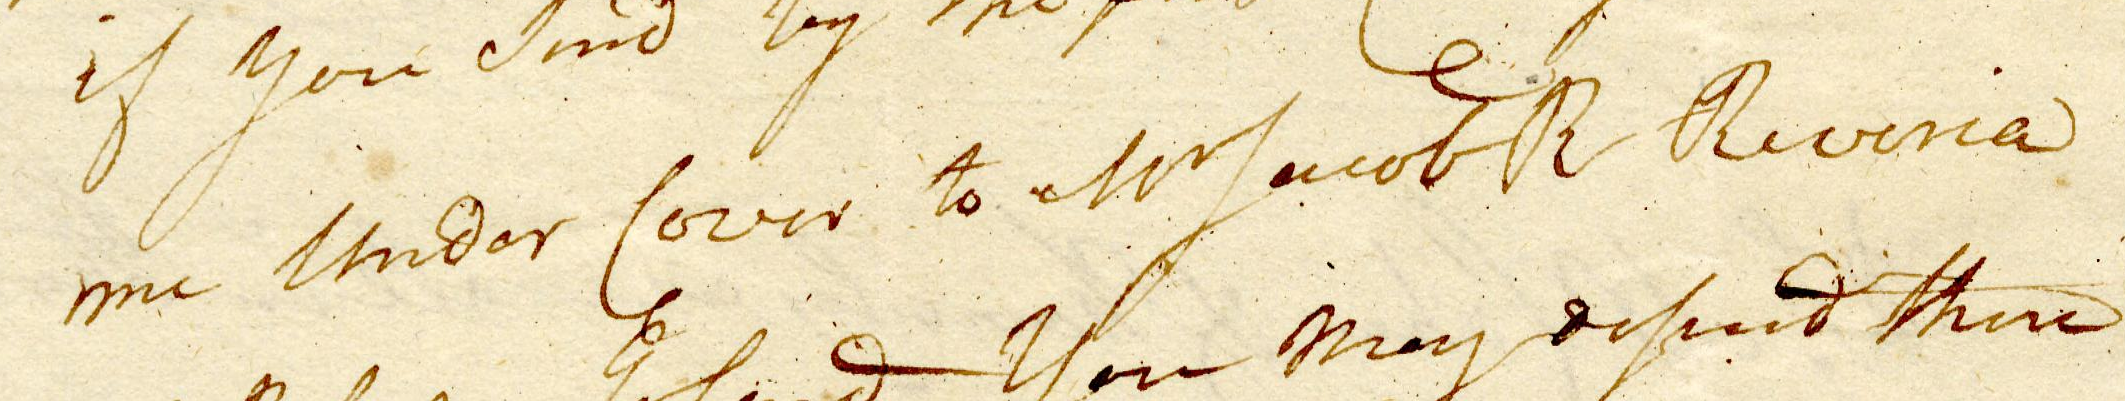me under Cover to M^r Jacob R Reveria
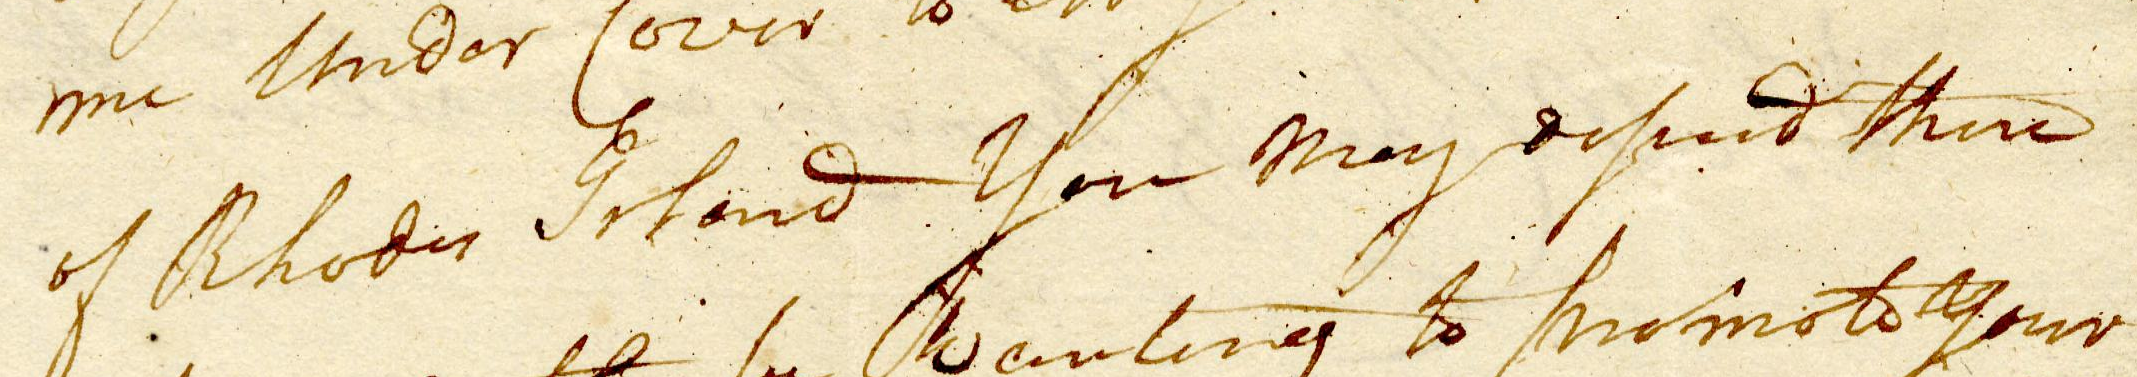of Rhodes Island You may depend there
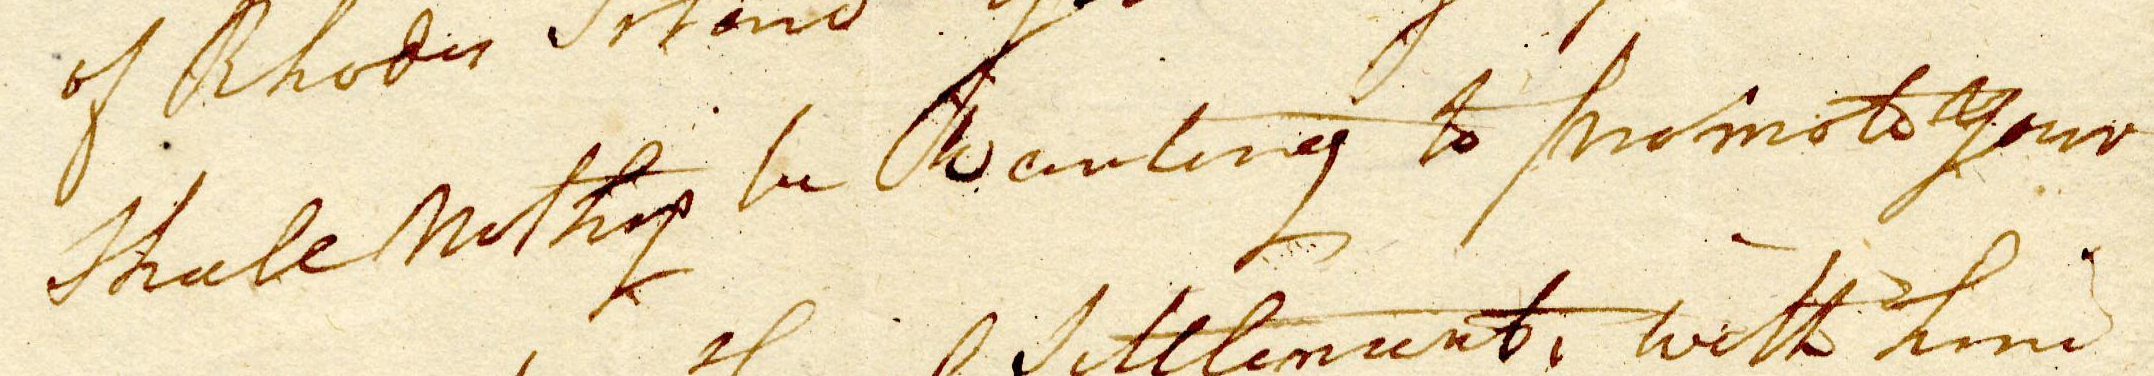shall nothing be wanting to promote your
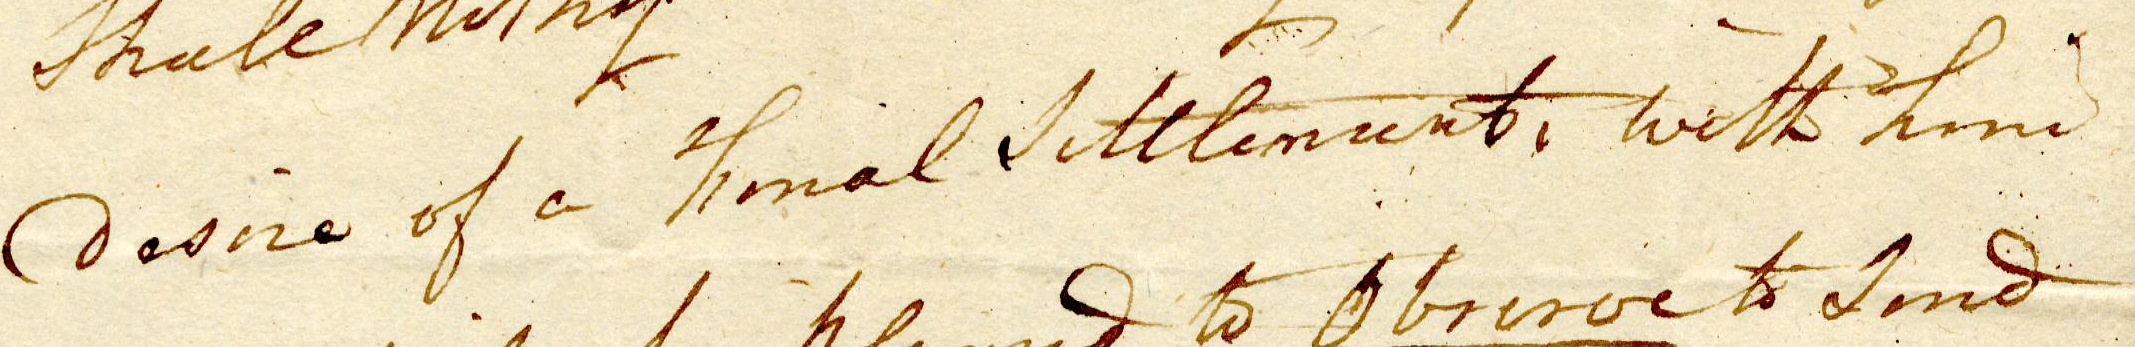desire of a final Settlement, with him
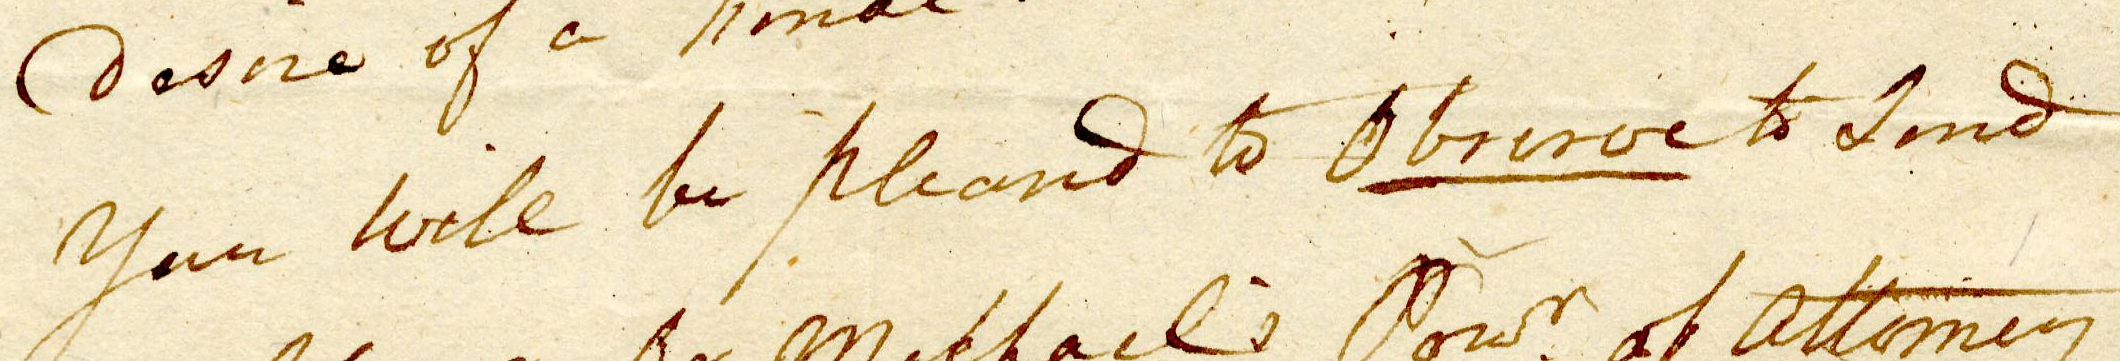you will be pleased to observe to send
